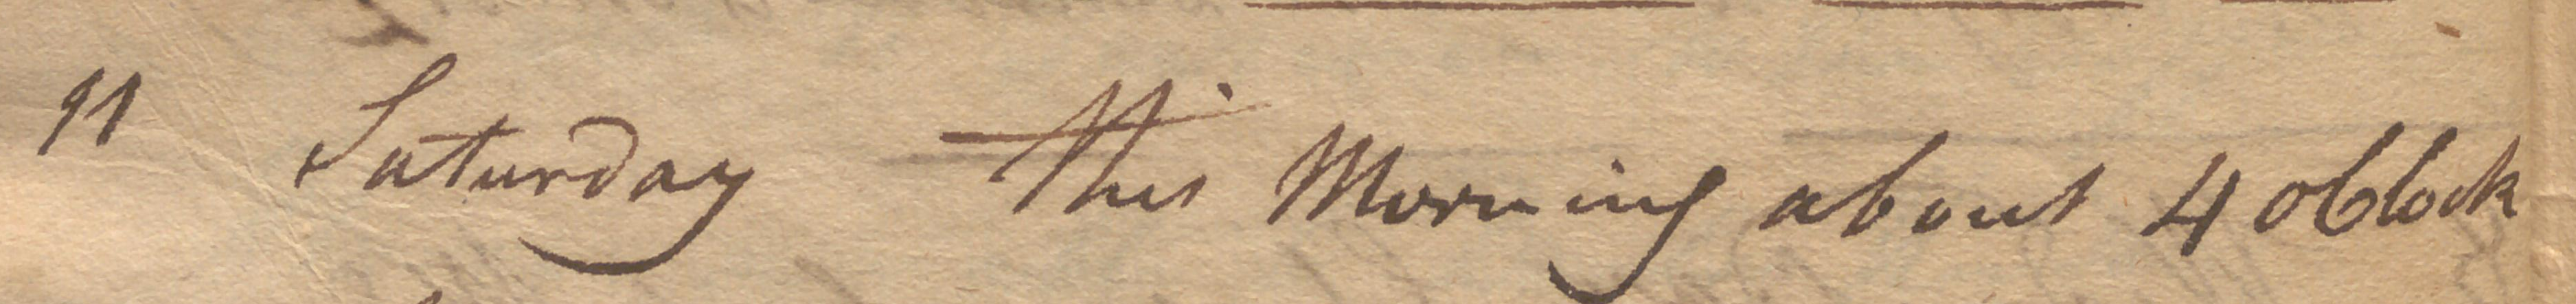11 Saturday this Morning about 4 oClock
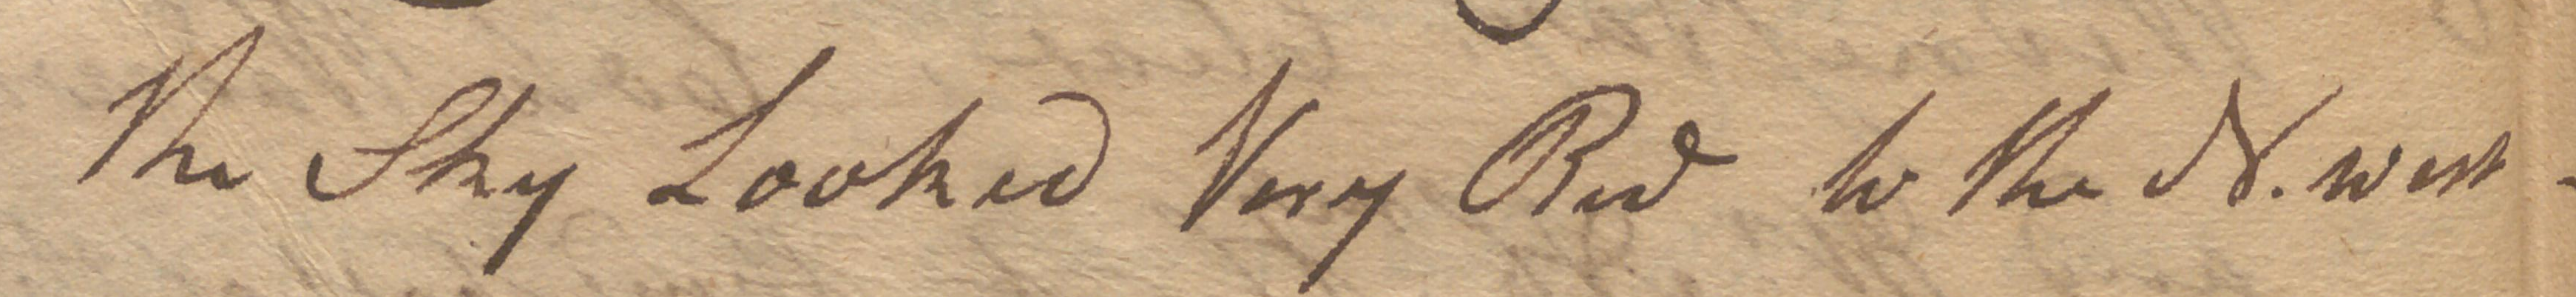The Sky Looked Very Red to the N. west
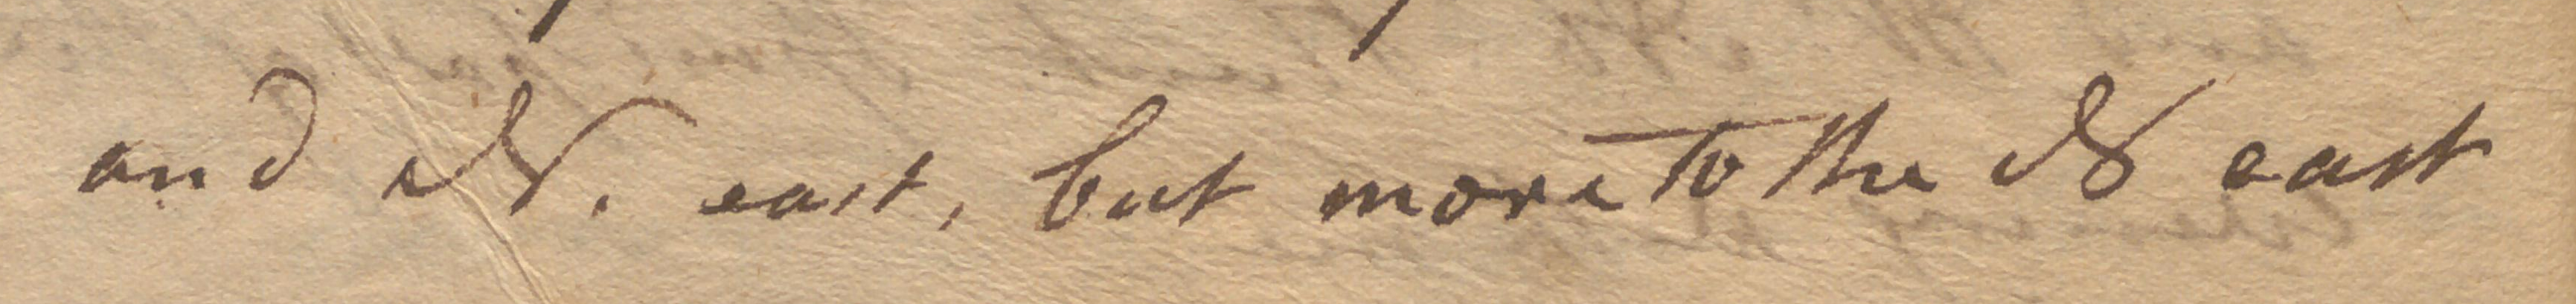and N. east, but more to the N east
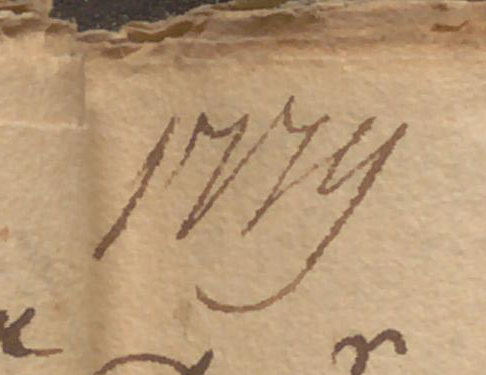1779
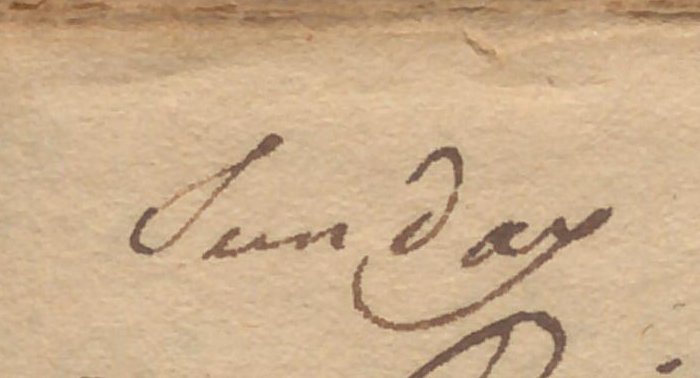Sunday
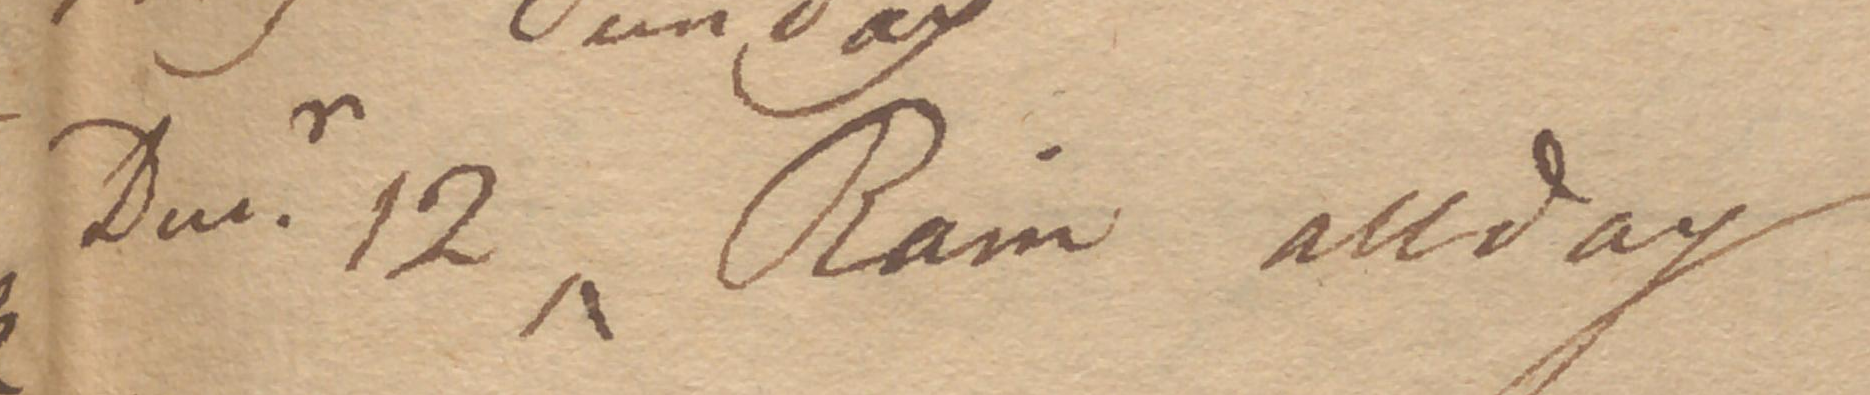Dec^r. 12 ^ Rain all day
